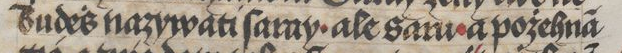budeṡ nazywati ſaray.ale saru.a pożehnā
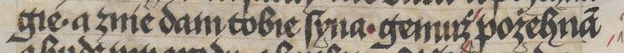gie.a zníe dam tobie ſyna.gemuż pożehnā
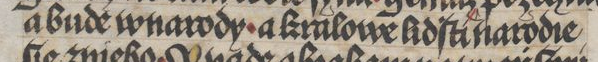a bude wnarody.a kralowe lidẛti narodie
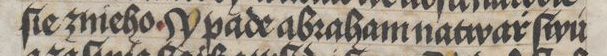ſie znieho.Y pade abraham natwaṙ ſwú
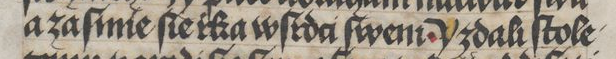a zaſmie ſie ṙka wſrdci ſwem.Y zdali ſtole¬
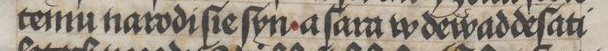temu narodi ſie ſyn.a ſara w dewaddeſati
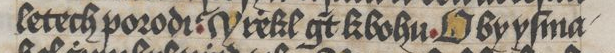letech porodi?.Y ṙekl ḡt k bohu.Oby yſma¬
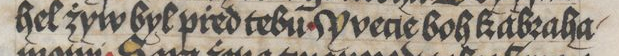hel żyw byl pṙed tebu.Y vecie boh k abraha¬
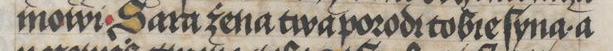mowi.Sara żena twa porodi tobie ſyna.a
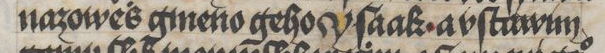nazoweṡ gmeno geho.Yſaak.a yſtawím
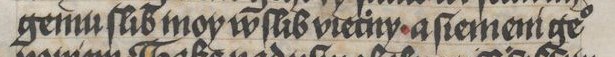gemu ſlib moy w ſlib vieċny.a ſiemeni geo
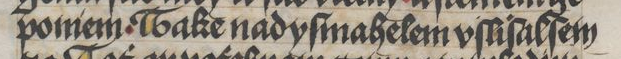poniem Take nad yſmahelem vſliẛal ſem.
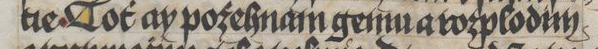tie.Toṫ ay pożehnam gemu a rozplodim
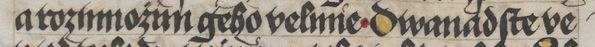a rozmnożím geho velmie.Dwanadſte ve¬
